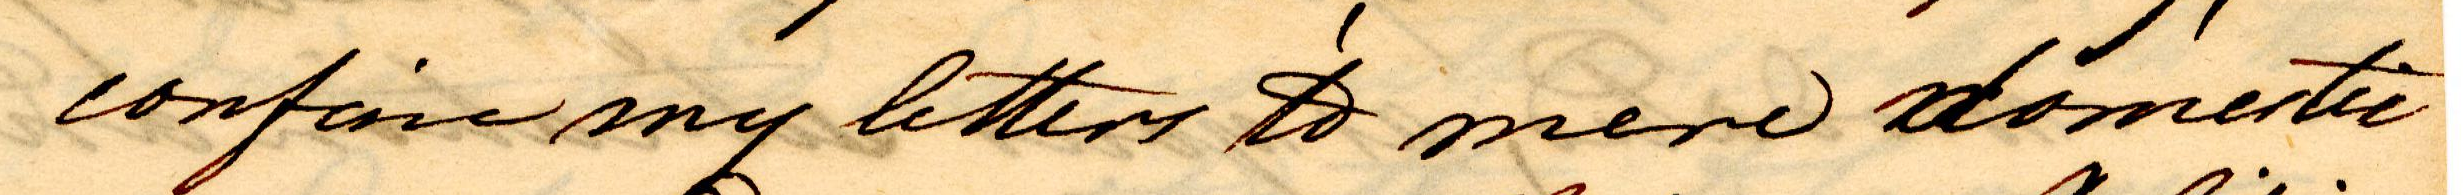confine my letters to mere domestic
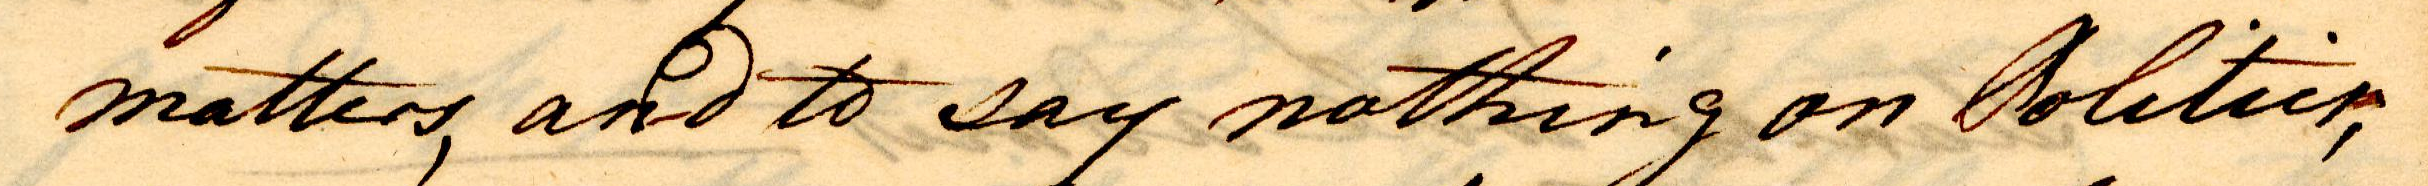matters, and to say nothing on Politics,
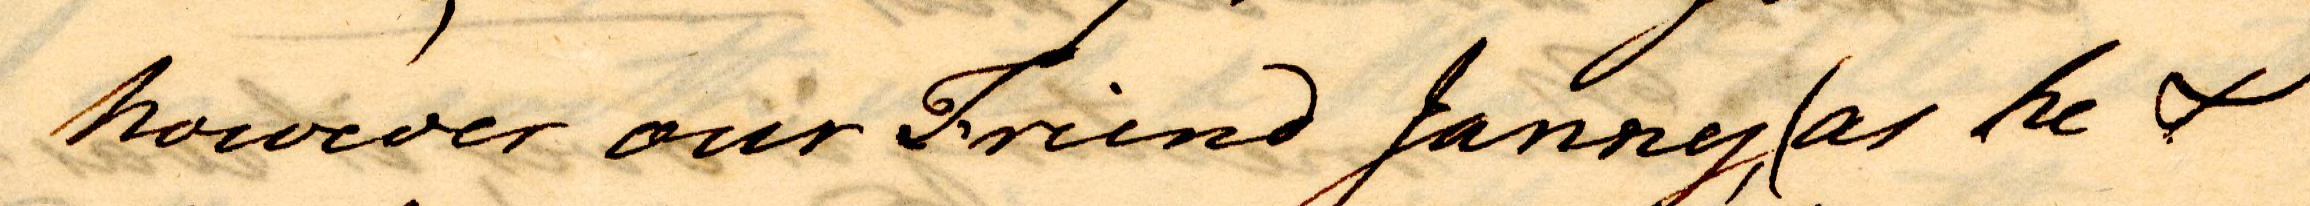however our Friend Janney, (as he &
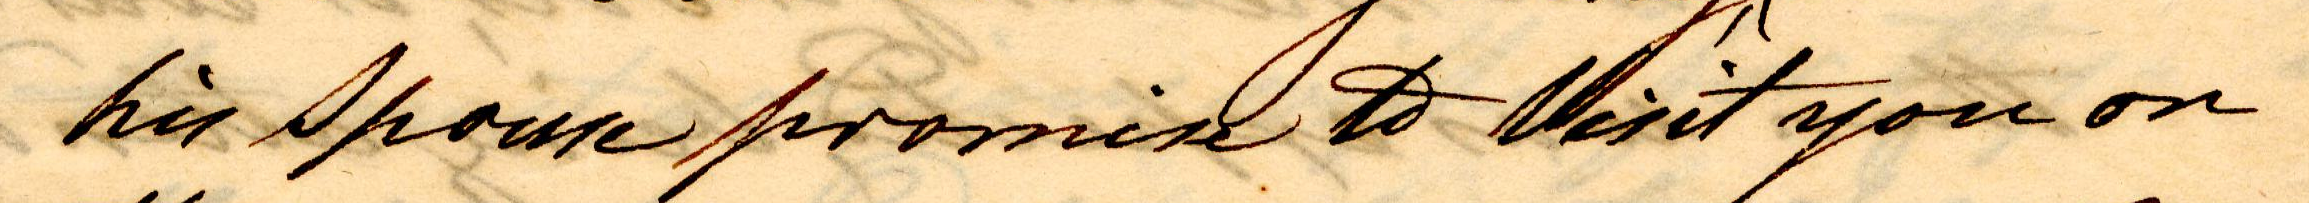his Spouse promise to Visit you on
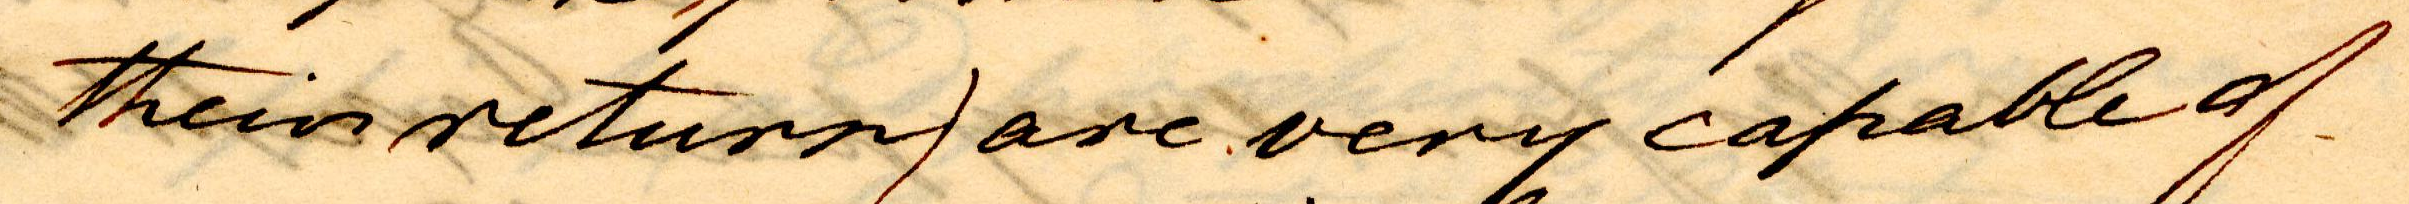their return) are very capable of
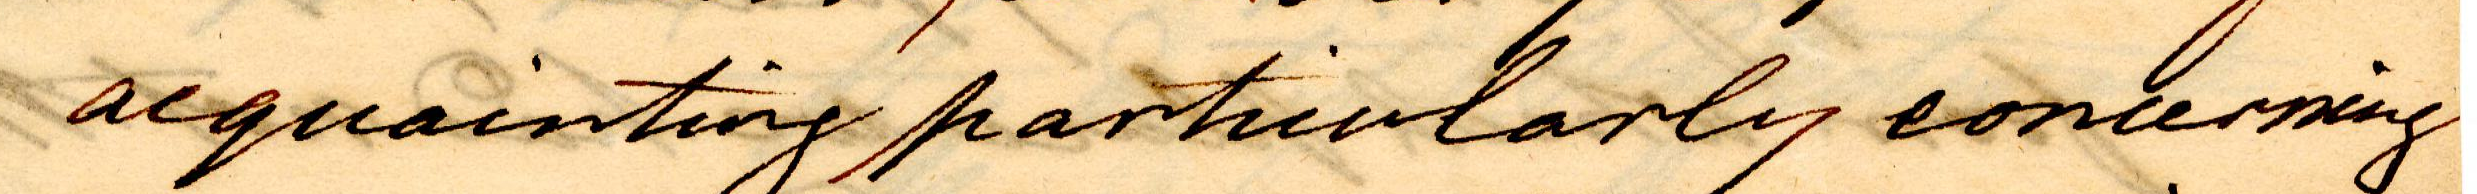acquainting particularly concerning
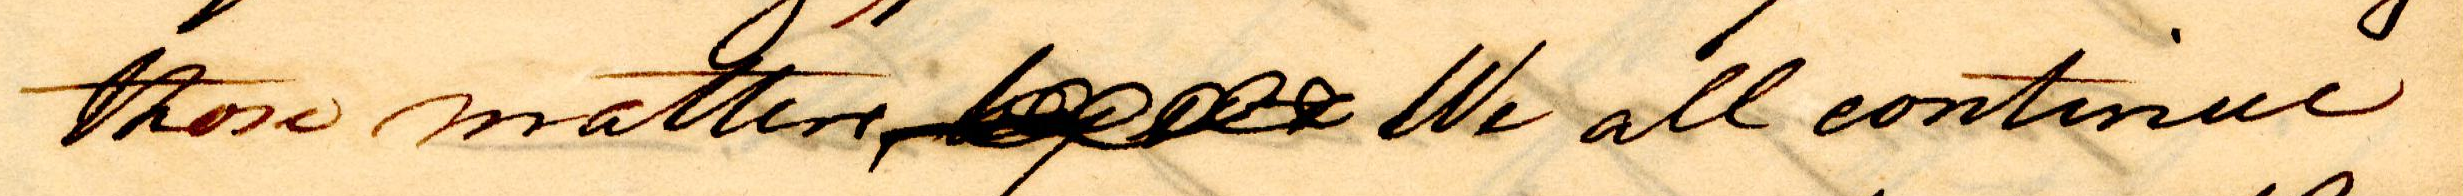those matters We all continue
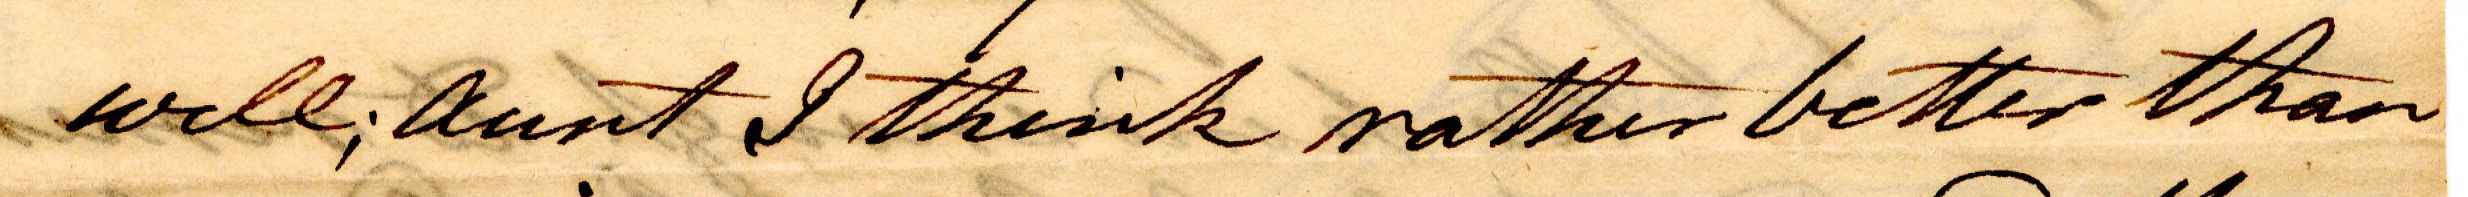well; Aunt I think rather better than
